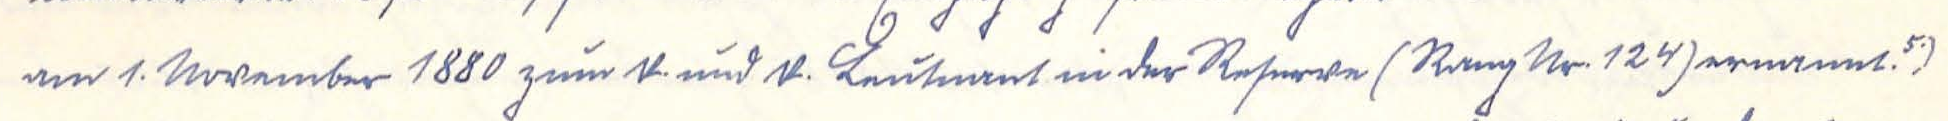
am 1. November 1880 zum k. und k. Leutnant in der Reserve (Rang Nr. 124) ernannt. 5.)
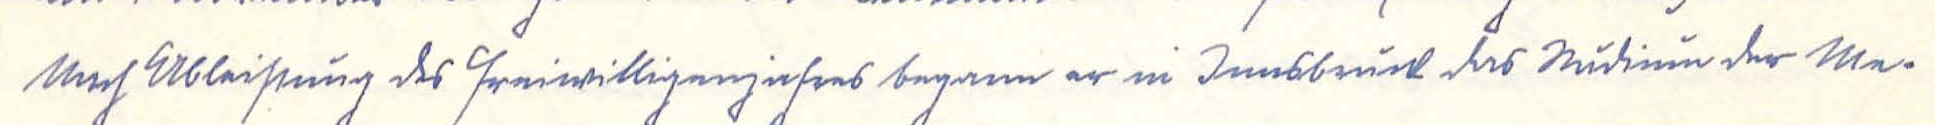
Nach Ableistung des Freiwilligenjahres begann er in Innsbruck das Studium der Med.
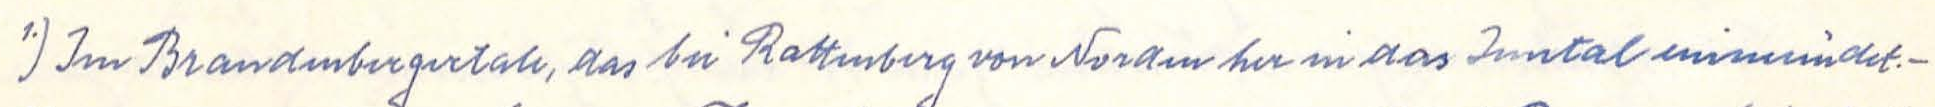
1.) Im Brandenbergertale, das bei Rattenberg von Norden her in das Inntal einmündet.
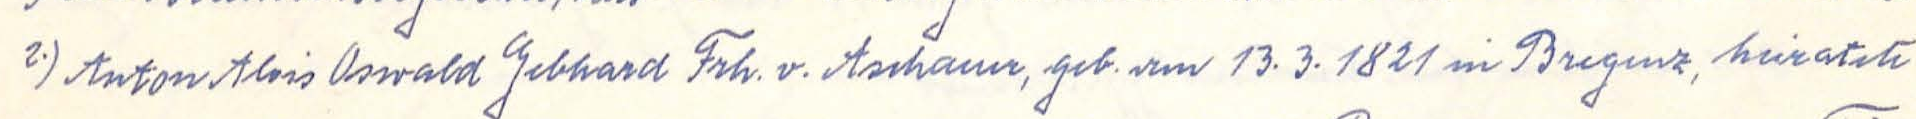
2.) Anton Alois Oswald Gebhard Frh. v. Aschauer, geb. am 13. 3. 1821 in Bregenz, heiratete
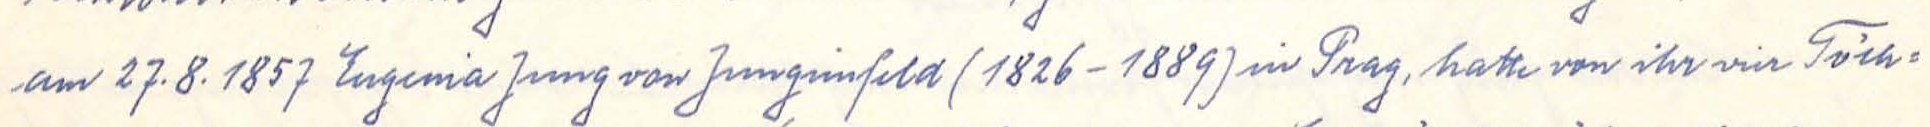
am 27. 8. 1857 Eugenia Jung von Junginsfeld (1826 - 1889) in Prag, hatte von ihre vier Töch-
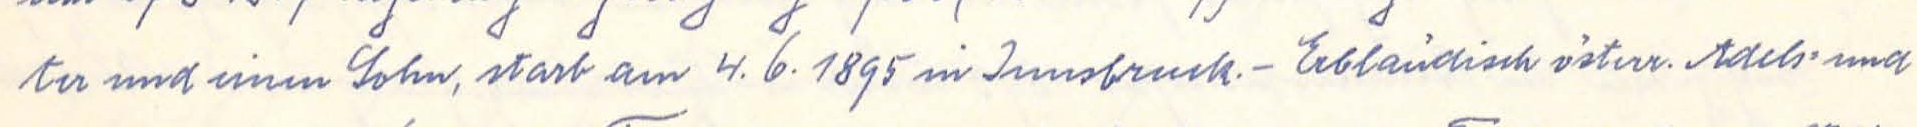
ter und einen Sohn, starb am 4. 6. 1895 in Innsbruck. - Erblandisch österr. Adels- und
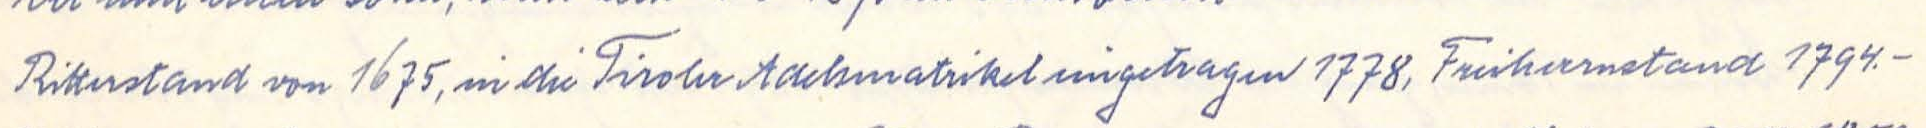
Ritterstand von 1675, in der Tiroler Adelsmatrikel eingetragen 1778, Freiherrnstand 1794.-
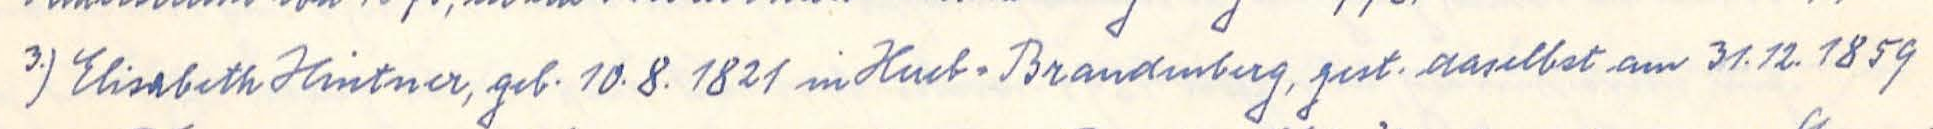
3.) Elisabeth Hintner, geb. 10. 8. 1821 in Hueb-Brandenberg, gest. daselbst am 31.12.1859
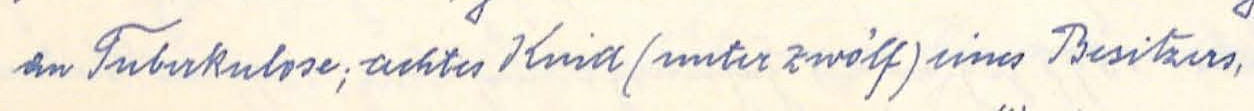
an Tuberkulose; achtes Kind (unter zwölf) eines Besitzers,
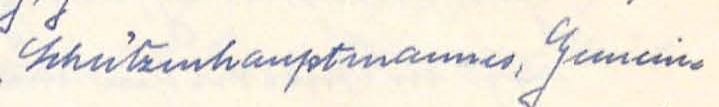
Schützenhauptmannes, Gemein-
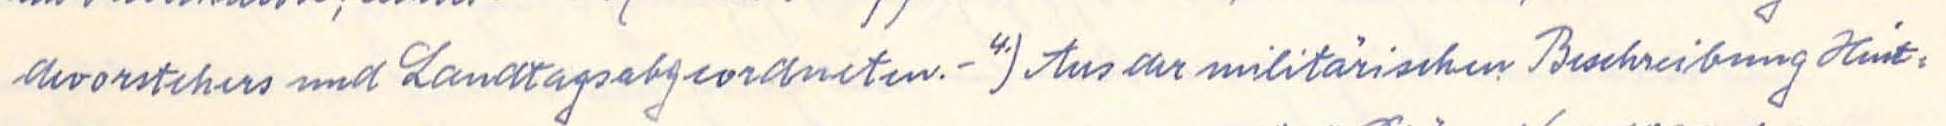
devorstehers und Landtagsabgeordneten. - 4.) Aus der militärischen Beschreibung Hint-
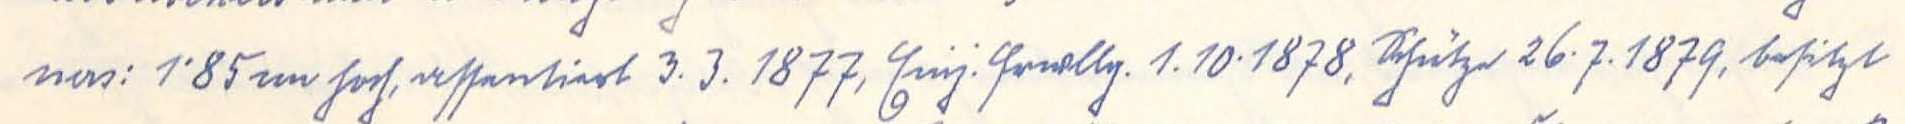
ners: 1'85 cm hoch, assentierd 3. 3. 1877, Einj. Frwllg. 1. 10. 1878, Schütze 26. 7. 1879, besitzt
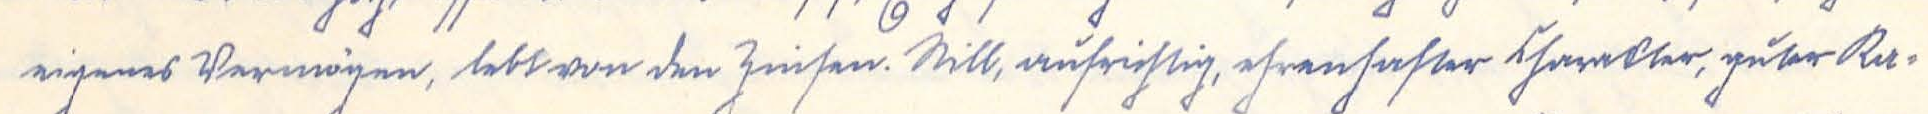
eigenes Vermögen, lebt von den Zinsen. Still, aufrichtig, ehrenhafter Charakter, guter Ka-
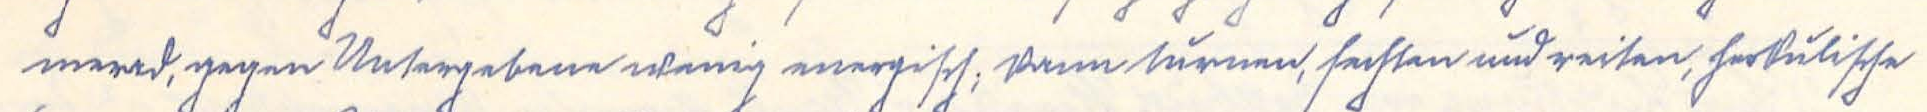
merad, gegen Untergebene wenig energisch; kann turnen fechten und reiten, herkulische
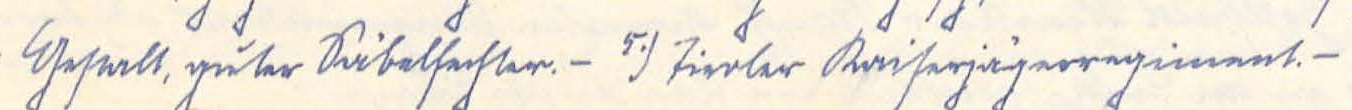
Gestalt, guter Säbelfechter. - 5.) Tiroler Kaiserjägerregiment.-
